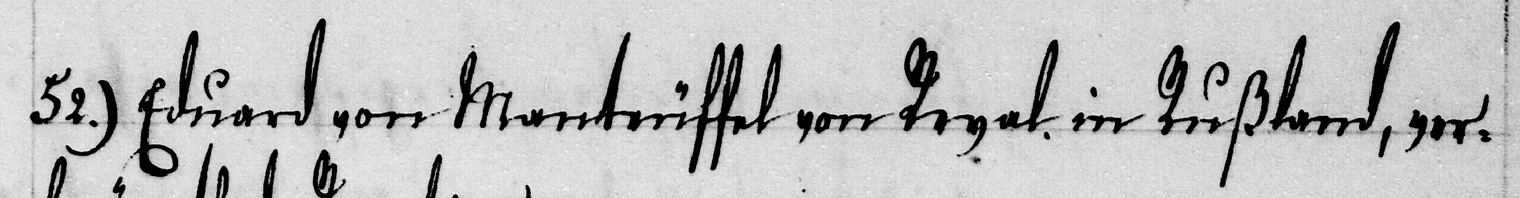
52.) Eduard von Manteuffel von Reval in Rußland, ver¬
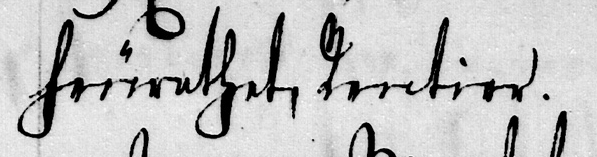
heirathet, Rentier.
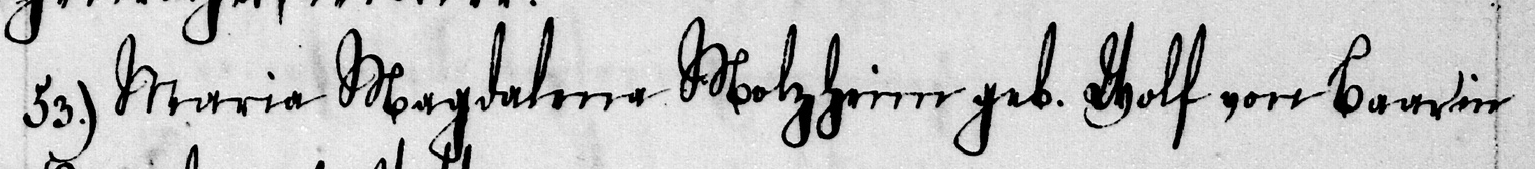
53.) Maria Magdalena Molzheim geb. Wolf von Baar in
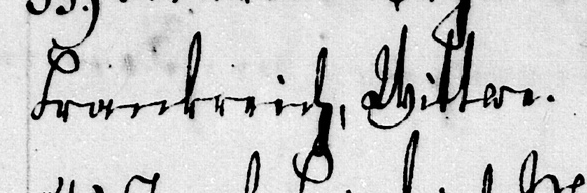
Frankreich, Wittwe.
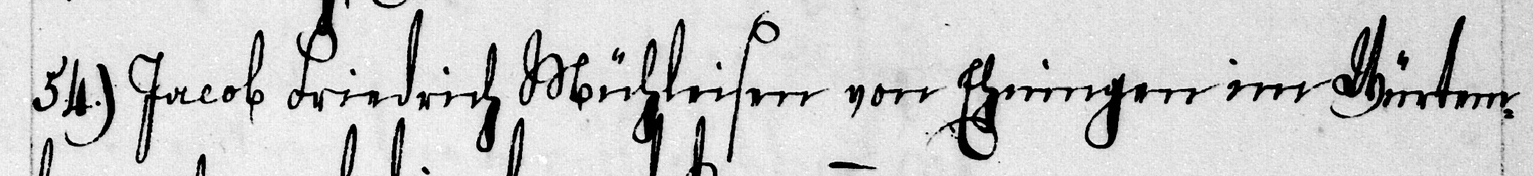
54.) Jacob Friedrich Mühleisen von Ehningen im Würtem¬
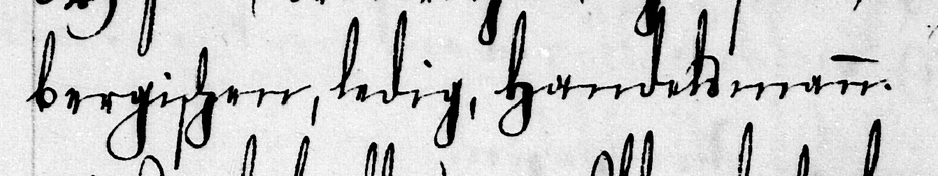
bergischen, ledig, Handelsmann.
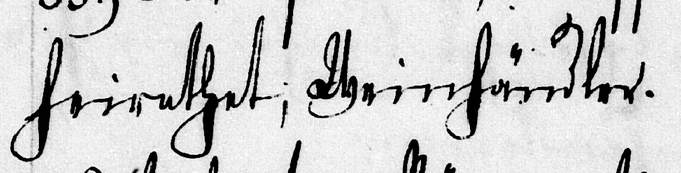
heirathet, Weinhändler.
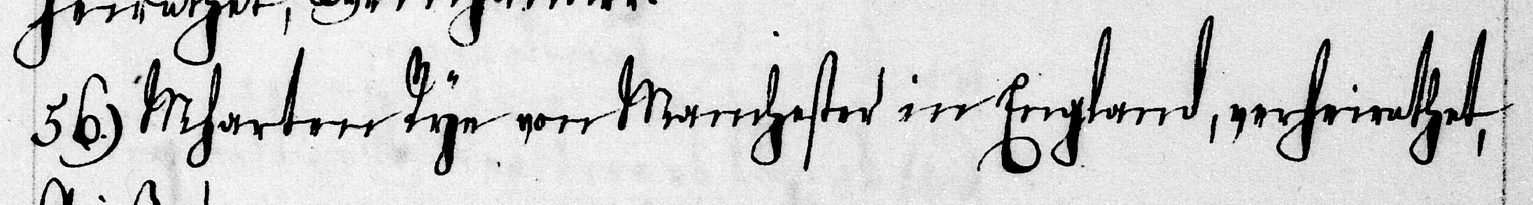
56.) Mharten Ryn von Manchester in England, verheirathet,
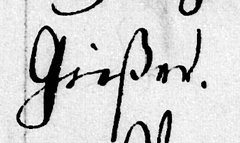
Gießer.
